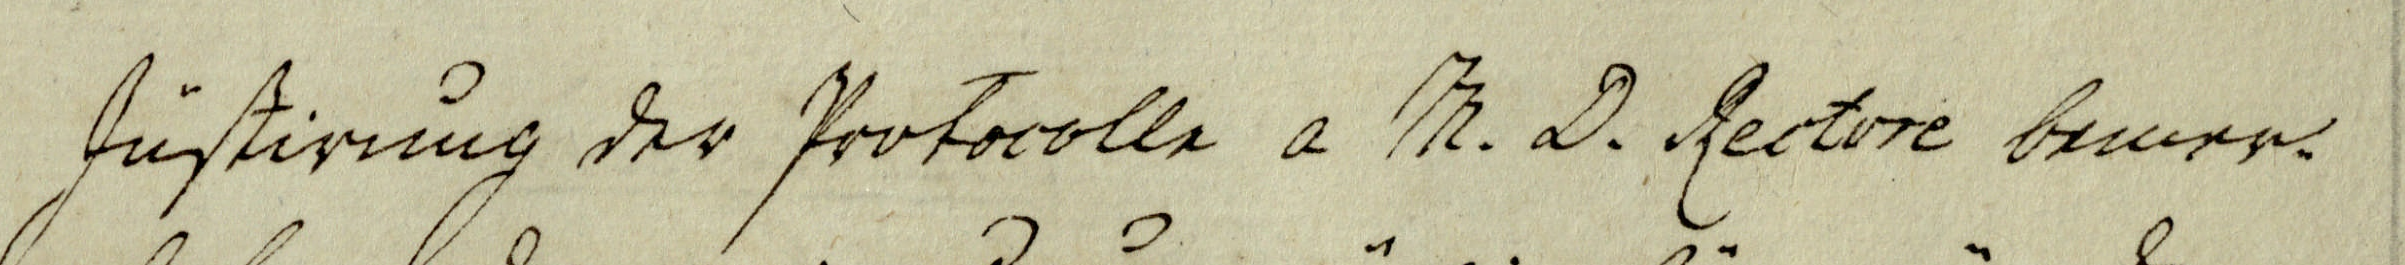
Jüstirung der Protocolle a M. D. Rectore bemer¬
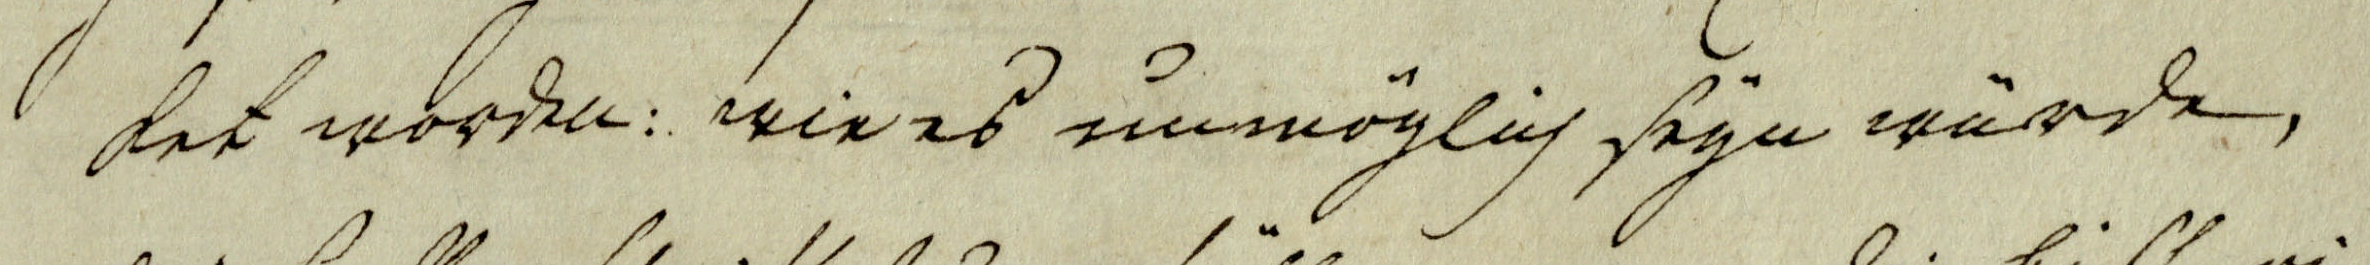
ket worden: wie es unmöglich seÿn würde,
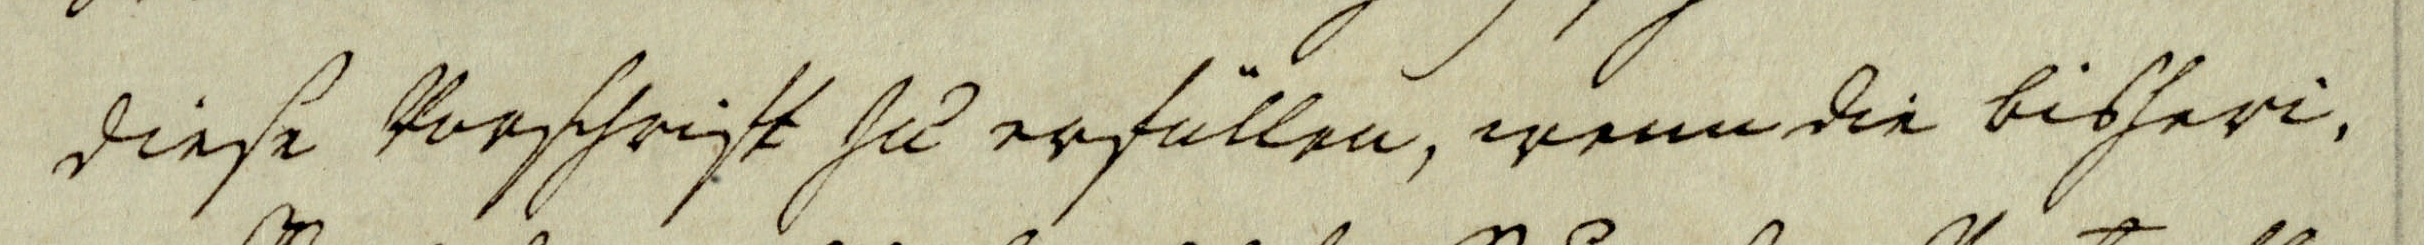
diese Vorschrift zu erfüllen, wenn die bisheri¬
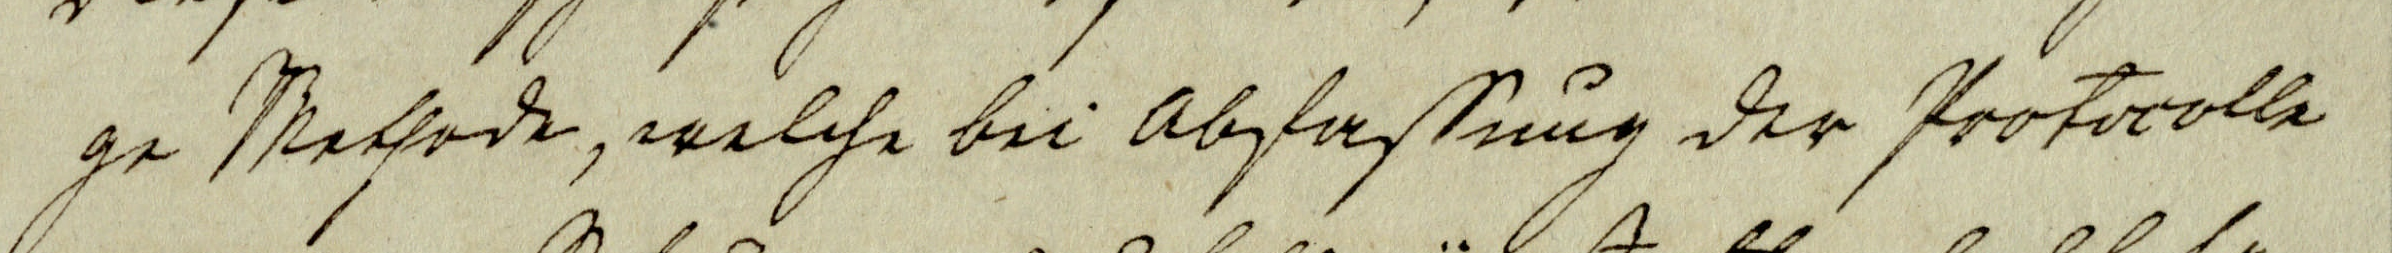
ge Methode, welche bei Abfassung der Protocolle
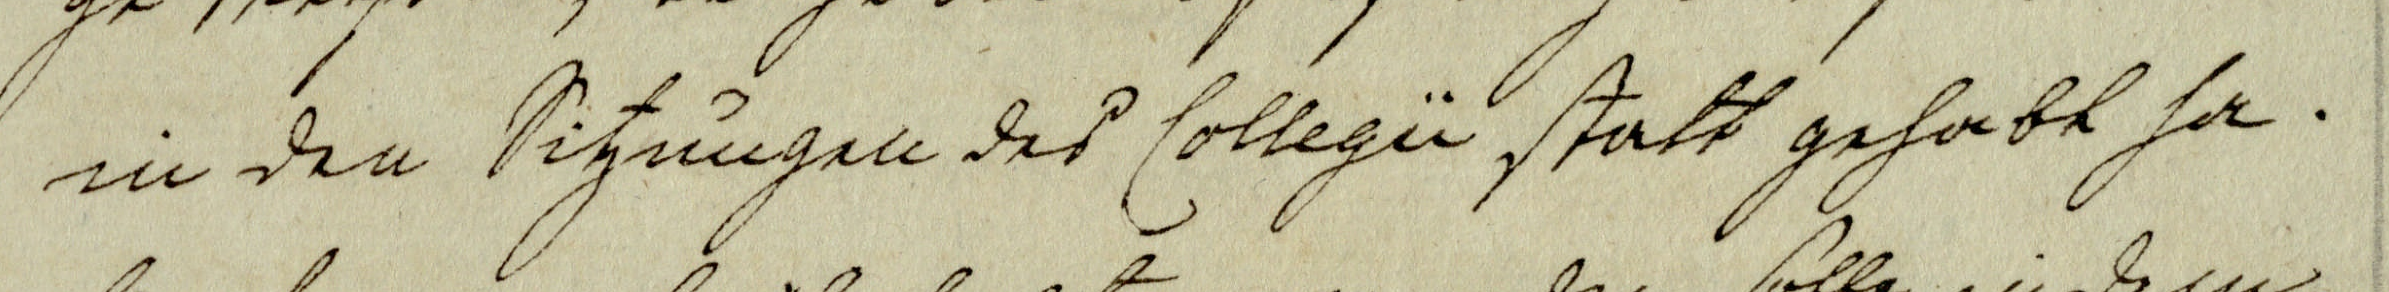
in den Sitzungen des Collegii statt gehabt ha¬
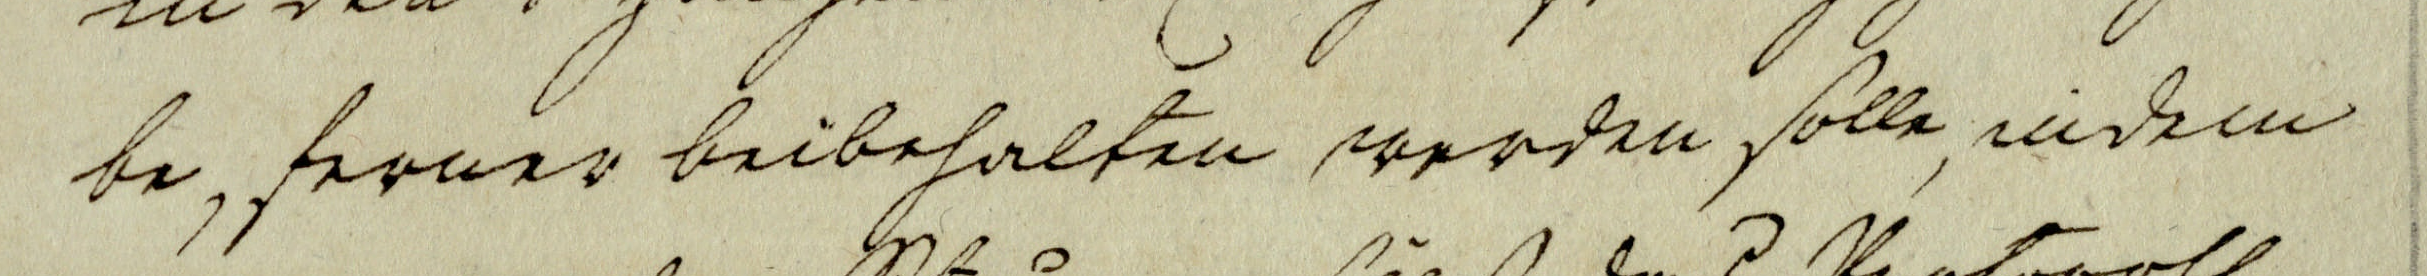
be, ferner beibehalten werden solle, indem
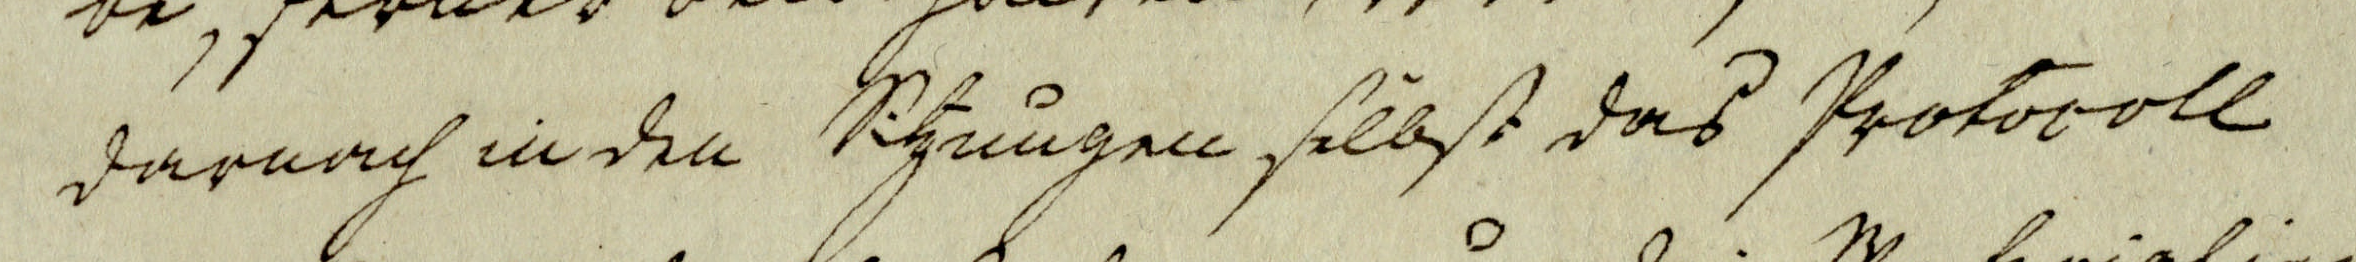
darnach in den Sitzungen selbst das Protocoll
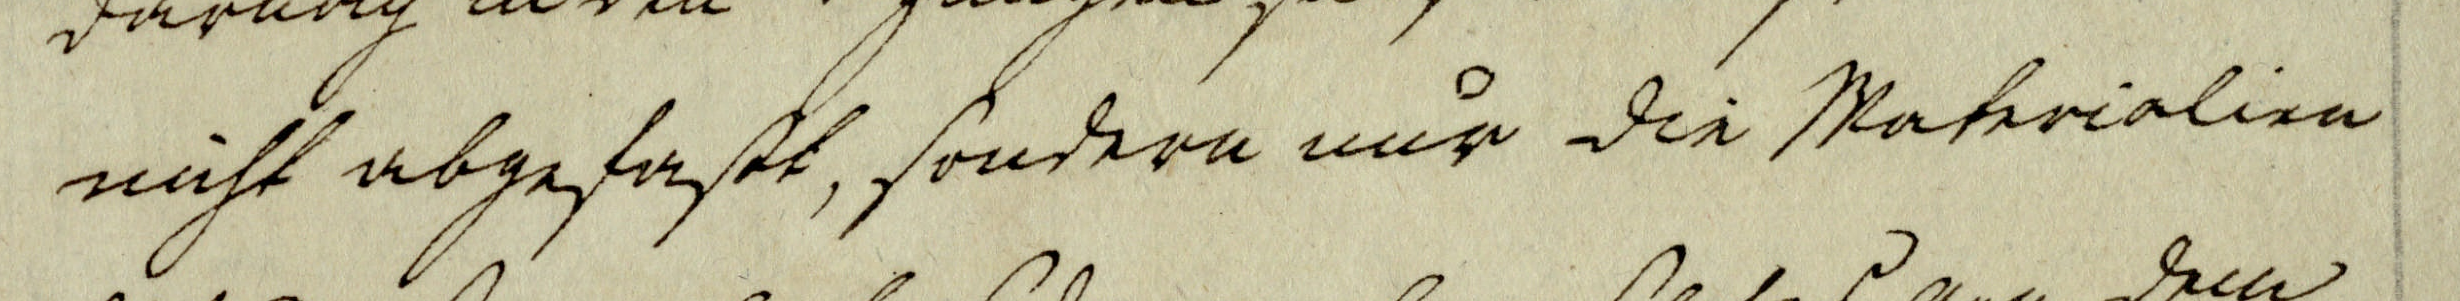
nicht abgefaßt, sondern nur die Materialien
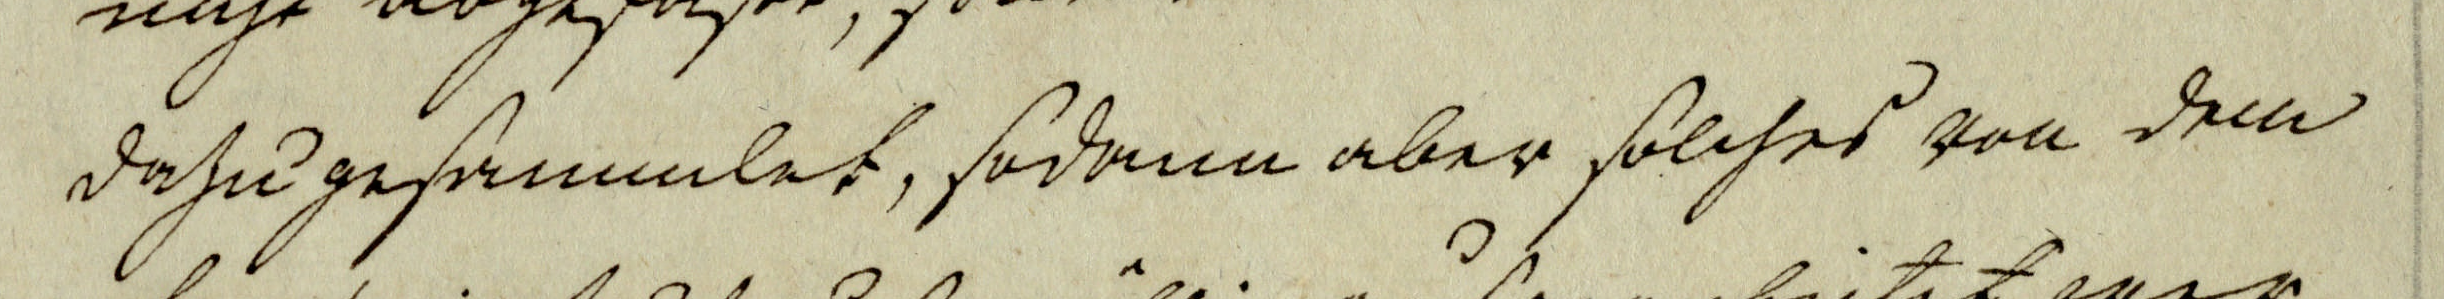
dazu gesammlet, sodann aber solches von dem
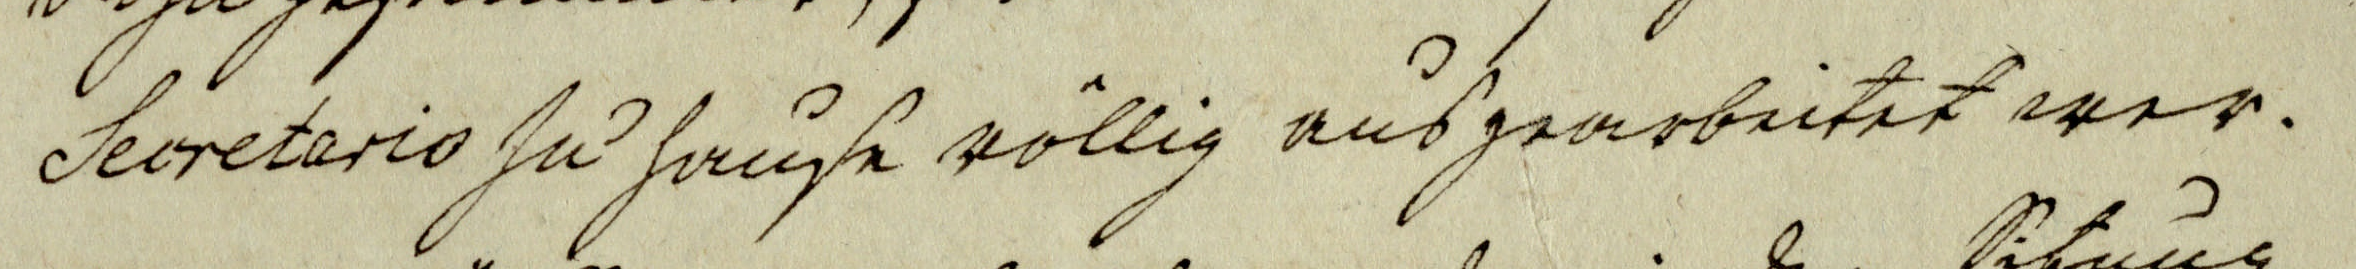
Secretario zu hause völlig ausgearbeitet wer¬
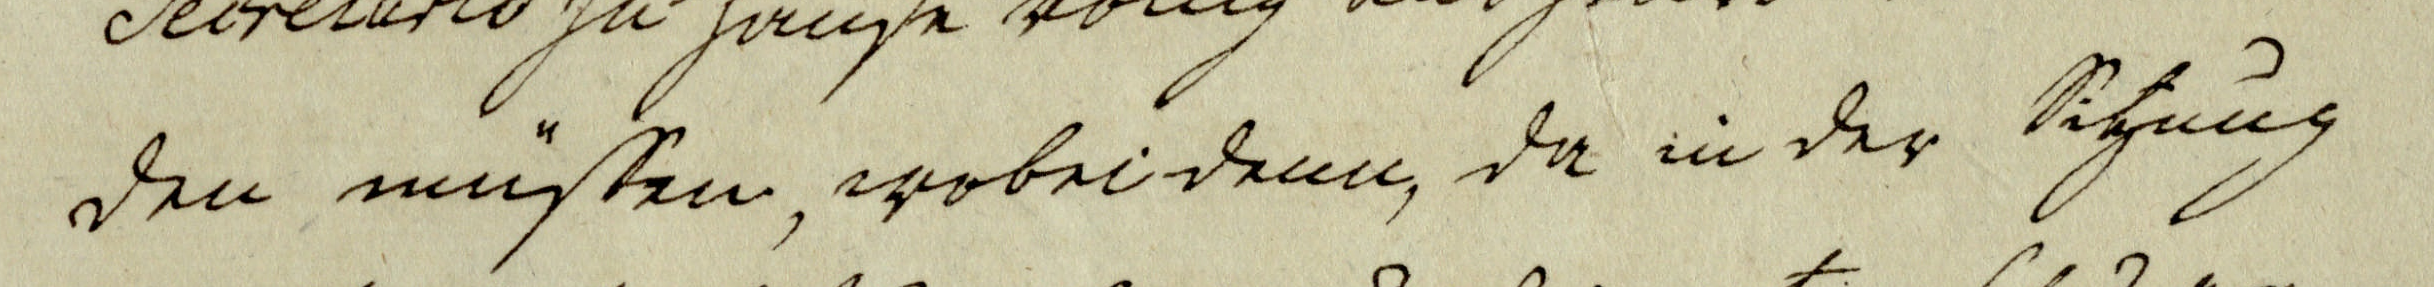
den müssten wobei denn, da in der Sitzung
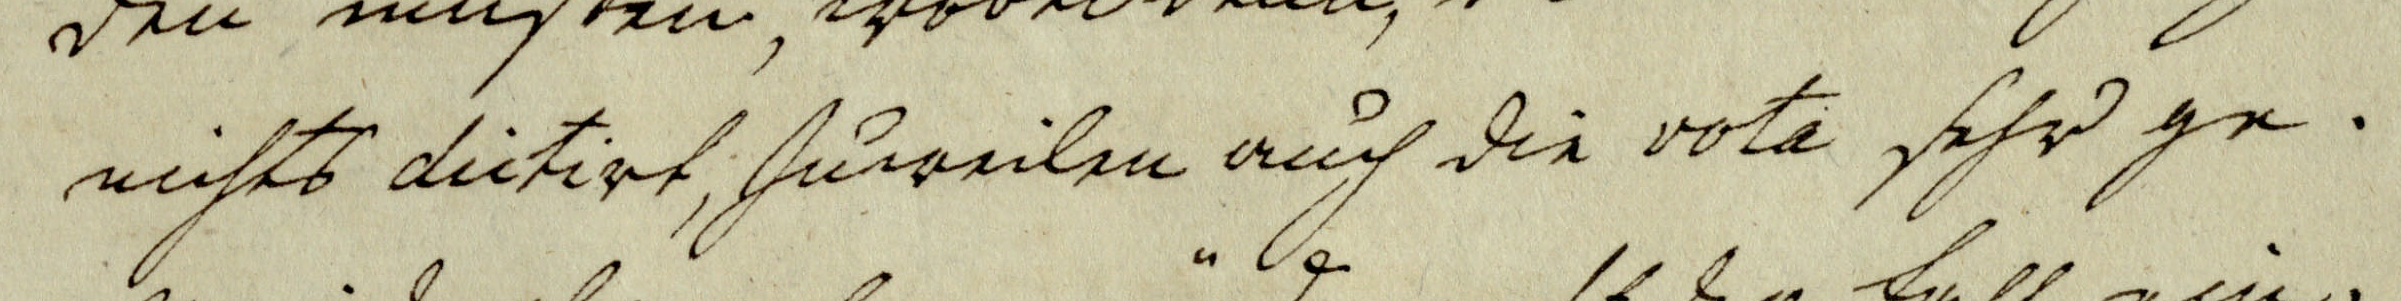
nichts dictirt, zuweilen auch die vota sehr ge¬
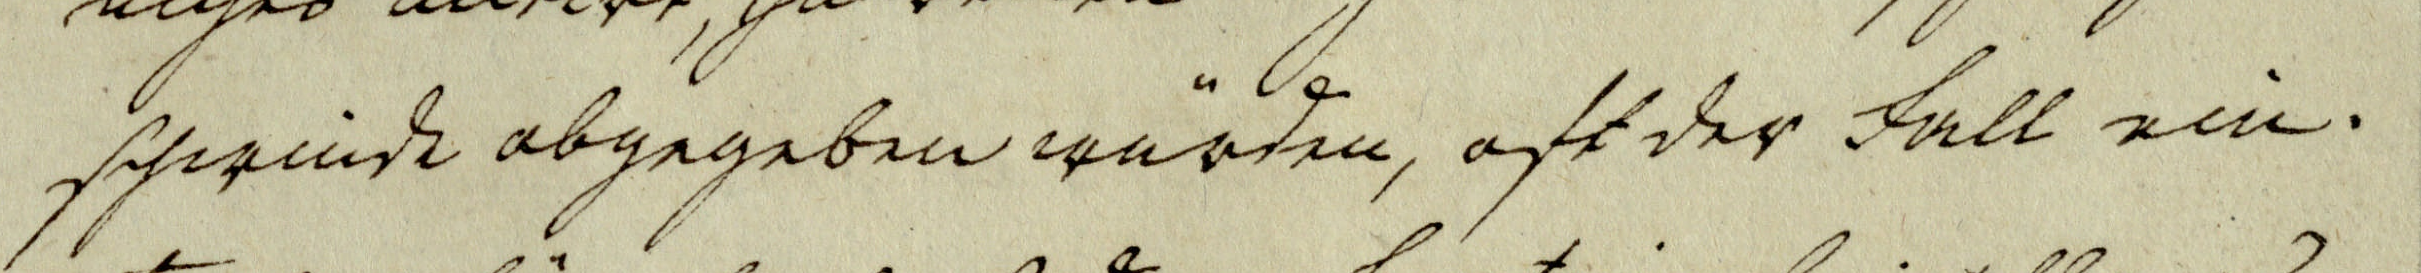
schwinde abgegeben würden, oft der Fall ein¬
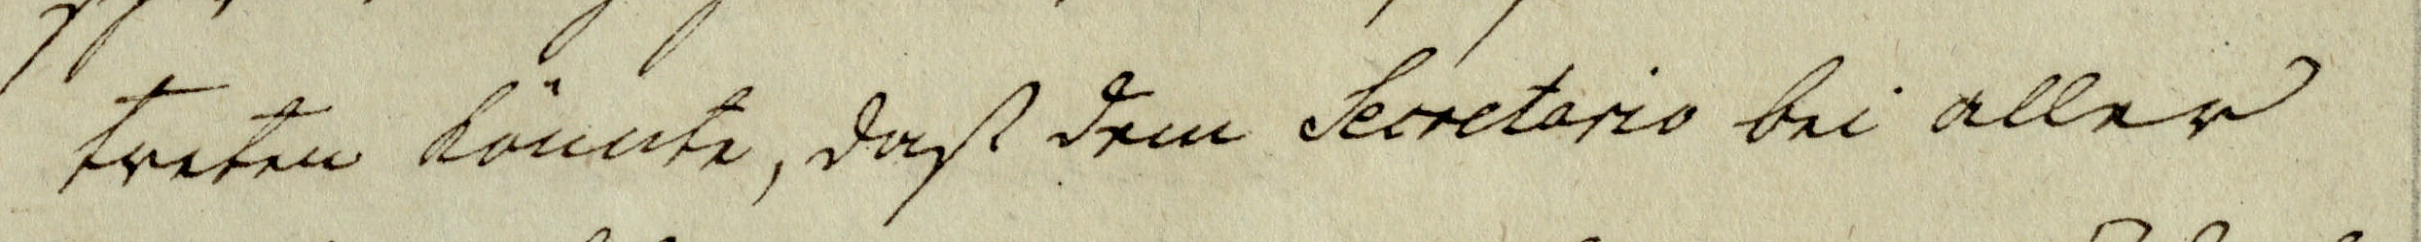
treten könnte, daß dem Secretario bei aller
